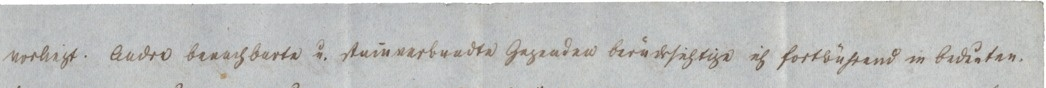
Andre benachbarte u. stammverwandte Gegenden berücksichtige ich fortwährend
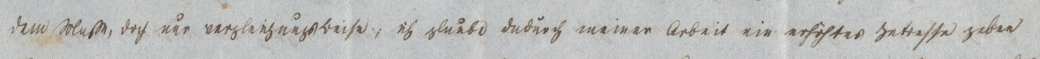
dem Maße, doch nur vergleichungsweise; ich glaube dadurch meiner Arbeit ein erhöhtes Intresse geben
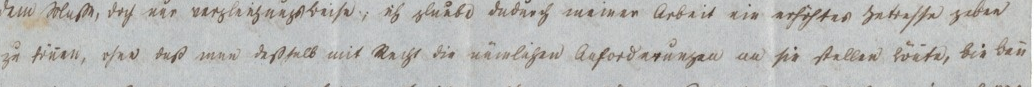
zu können, ohne daß man deßhalb mit Recht die nämlichen Anforderungen an sie stellen könnte, wie wenn
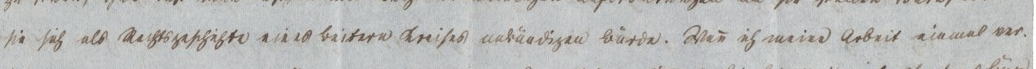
sie sich als Rechtsgeschichte eines weitern Kreises ankündigen würde. Wenn ich meine Arbeit einmal ver-
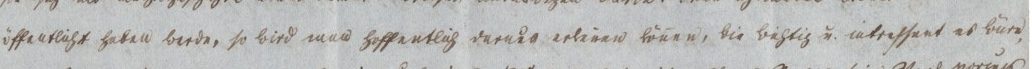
öffentlicht haben werde, so wird man hoffentlich daraus erkennen können, wie wichtig u. intressant es wäre,
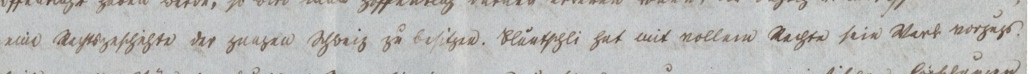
eine Rechtsgeschichte der ganzen Schweiz zu besitzen. Bluntschli hat mit vollem Rechte sein Werk vorzugs-
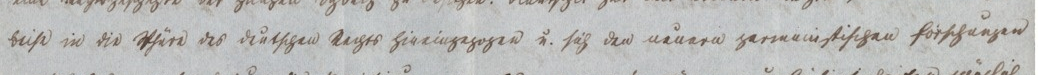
weise in die Sphäre des deutschen Rechts hineingezogen u. sich den neuern germanistischen Forschungen
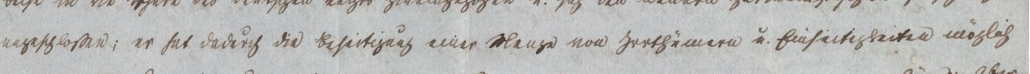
angeschlossen; er hat dadurch die Beseitigung einer Menge von Irrthümern u. Einseitigkeiten möglich
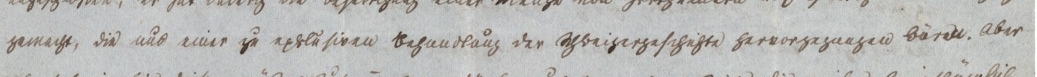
gemacht, die aus einer zu exklusiven Behandlung der Schweizergeschichte hervorgegangen wären. Aber
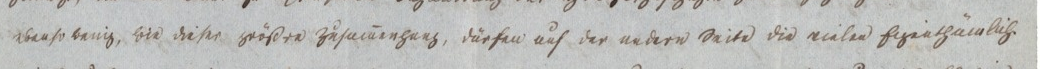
ebenso wenig, wie dieser größre Zusammenhang, dürfen auf der andern Seite die vielen Eigenthümlich-
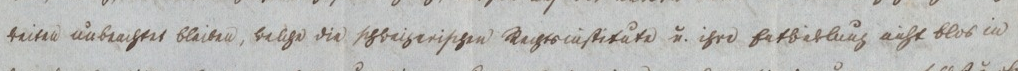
keiten unbeachtet bleiben, welche die schweizerischen Rechtsinstitute u. ihre Entwicklung nicht blos in
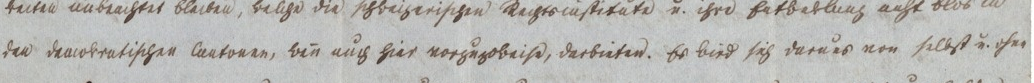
den demokratischen Cantonen, wenn auch hier vorzugsweise, darbieten. Es wird sich daraus von selbst u. ohne
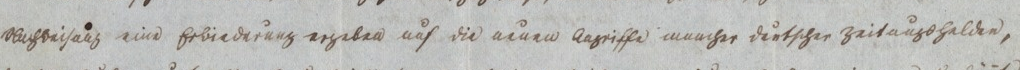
Nachweisung eine Erwiederung ergeben auf die neuen Angriffe mancher deutscher Zeitungshelden,
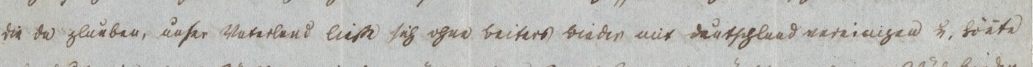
die da glauben, unser Vaterland ließe sich ohne weiters wieder mit Deutschland vereinigen u. könnte
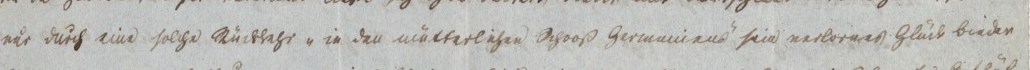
nur durch eine solche Rückkehr «in den mütterlichen Schooß Germaniens» sein verlornes Glück wieder
